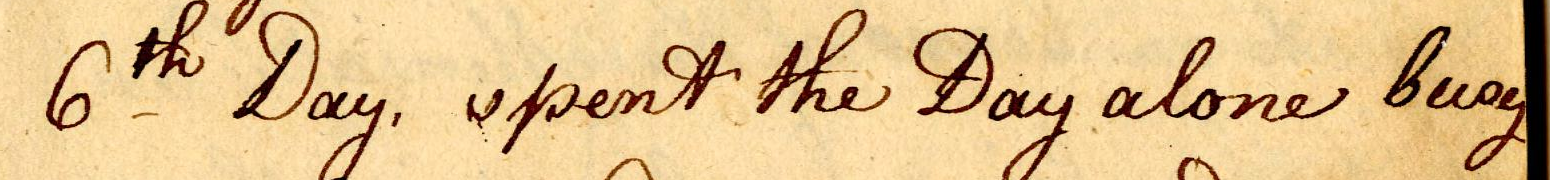6^th Day, spent the Day alone busy
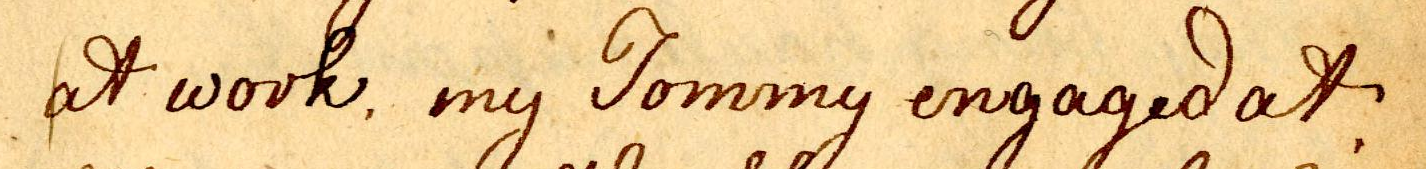at work, my Tommy engaged at
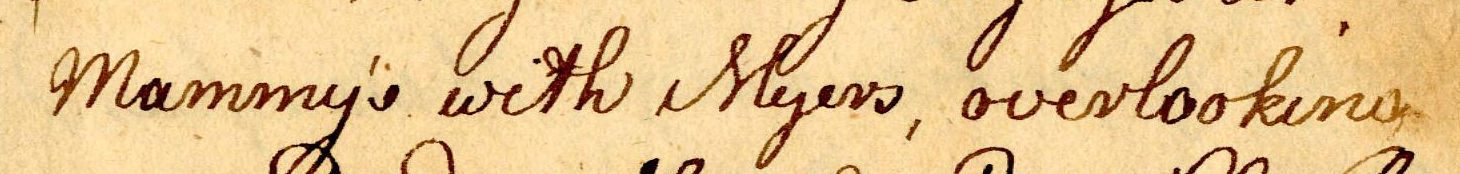Mammy's with Myers, overlooking
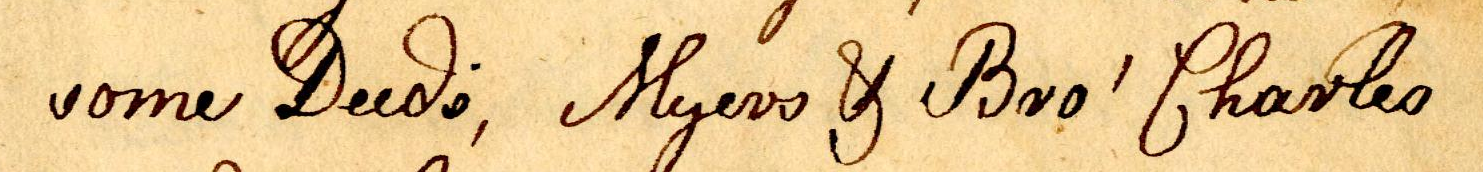some Deeds, Myers & Bro' Charles
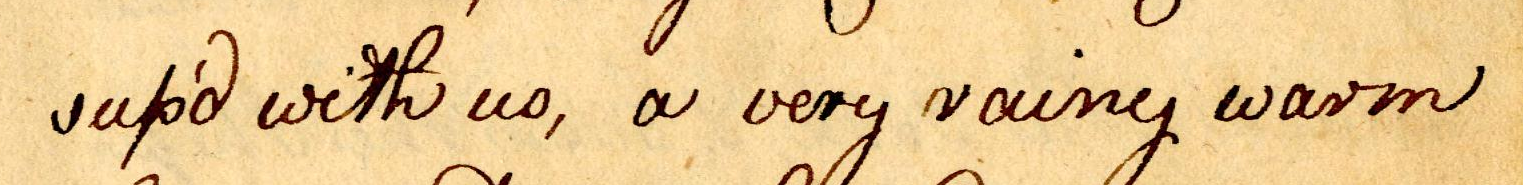sup'd with us, a very rainy warm
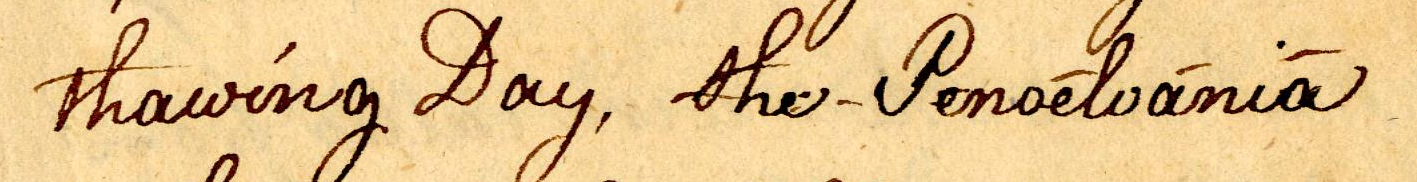thawing Day. the Penselvania
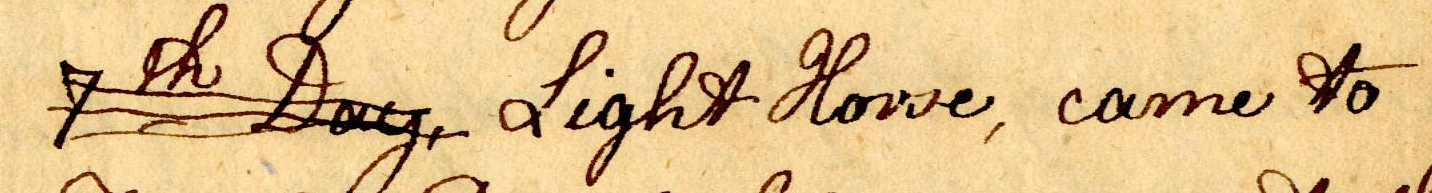[7^th Day] Light House, came to
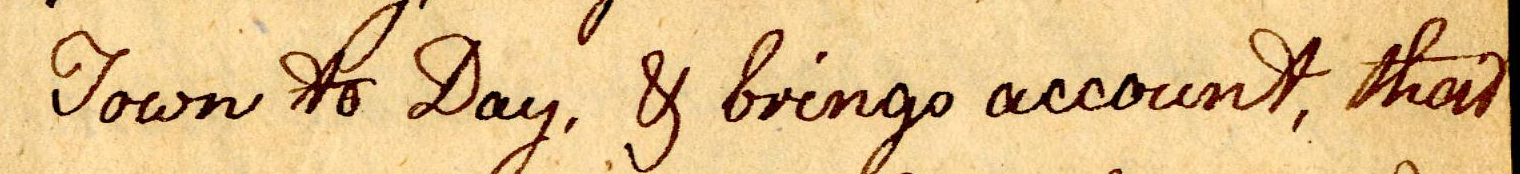Town to Day, & brings account, that
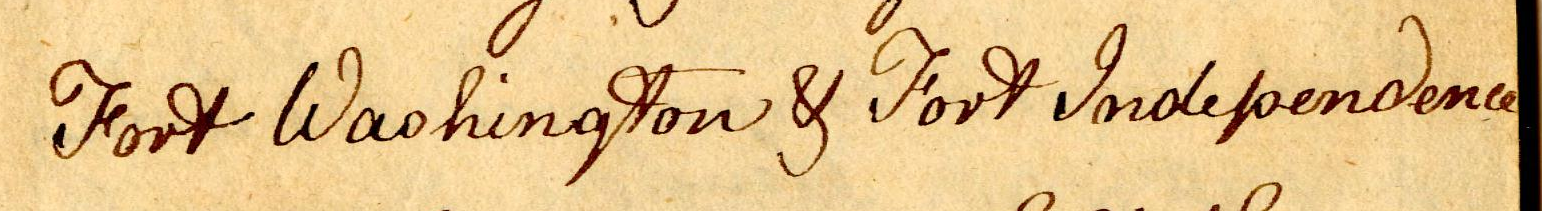Fort Washington & Fort Independence
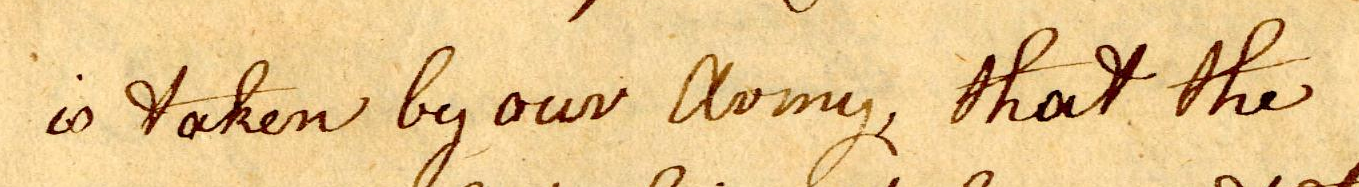is taken by our Army, that the
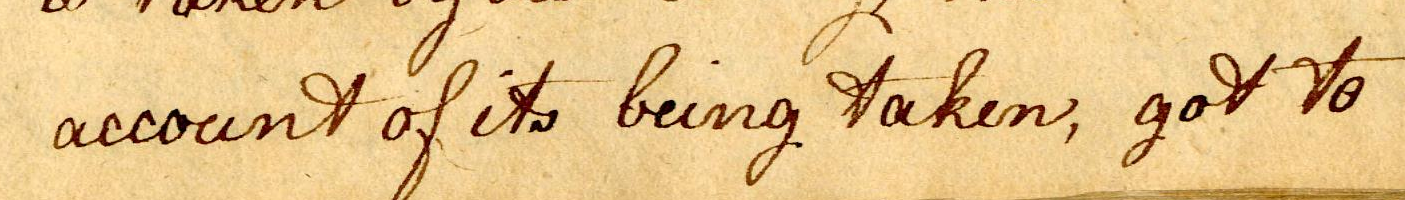account of its being taken, got to
